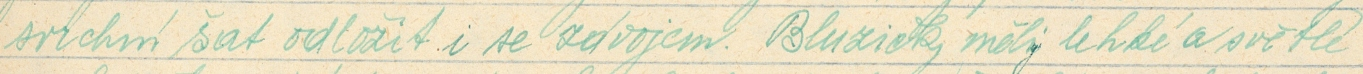svrchní šat odložit i se závojem. Bluzičky měly lehké a světlé
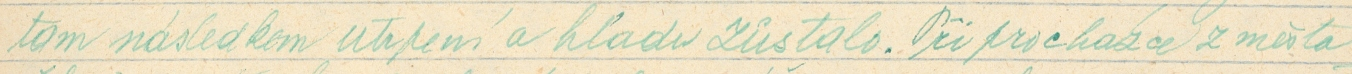tam následkem utrpení a hladu zůstalo. Při procházce z města
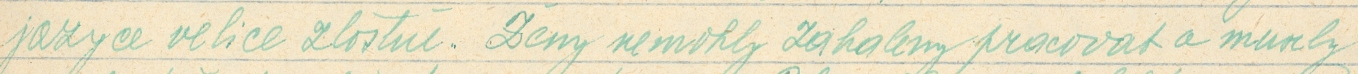jazyce velice zlostně. Ženy nemohly zahaleny pracovat a musely
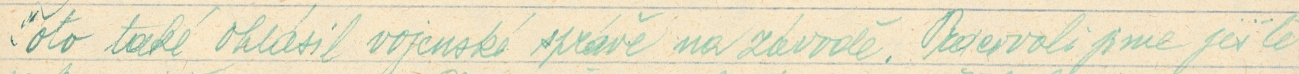Toto také ohlásil vojenské správě na závodě. Pracovali jsme ještě
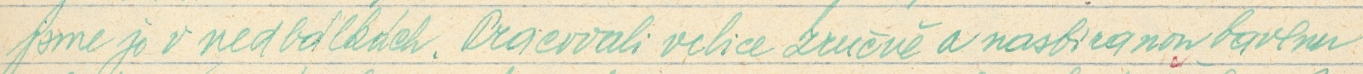jsme je v nedbálkách. Pracovali velice zručně a nasbíranou bavlnu
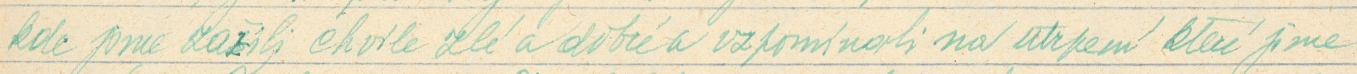kde jsme zažili chvíle zlé a dobré a vzpomínali na utrpení které jsme
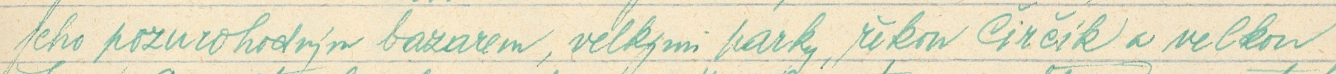jeho pozurohodným bazarem, velkými parky, řekou Čirčík a velkou
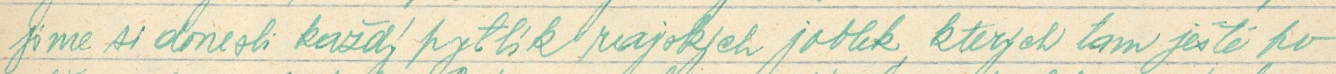jsme si donesli každý pytlík rajských jablek, kterých tam ještě po
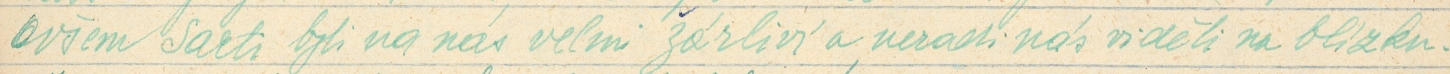Ovšem Sarti byli na nás velmi žárliví a neradi nás viděli na blízku.
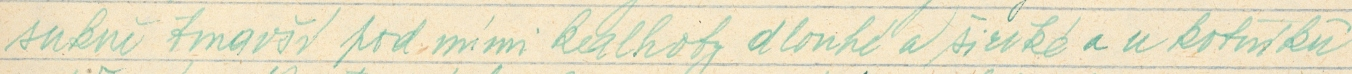sukně tmavší pod ními kalhoty dlouhé a široké a u kotníků
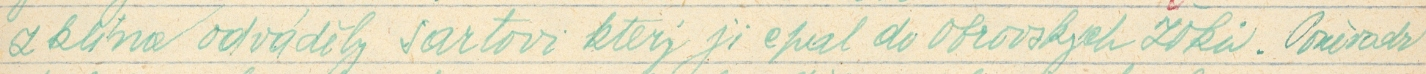z klína odváděly sartovi který ji cpal do obrovských žoků. Poněvadž
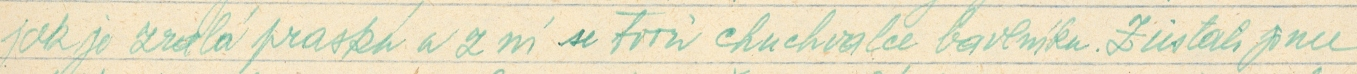jak je zralá praská a z ní se tvoří chuchvalce bavlníku. Zůstali jsme
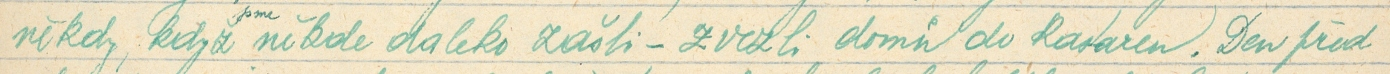někdy, když jsme někde daleko zašli - zvezli domů do kasáren. Den před
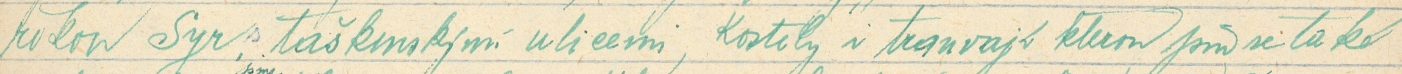řekou Syrs, taškenskými ulicemi, kostely i tranvají kterou jsem se také
